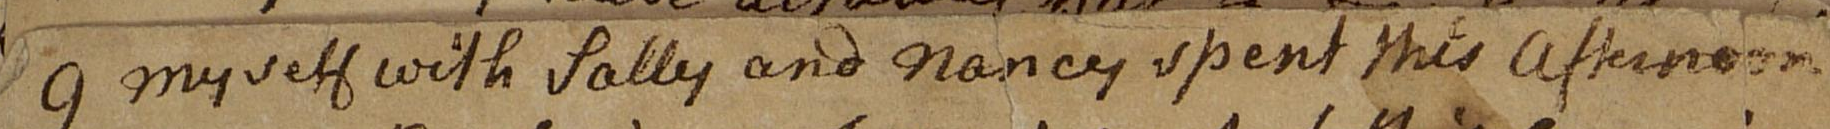9 myself with Sally and Nancy spent this Afternoon
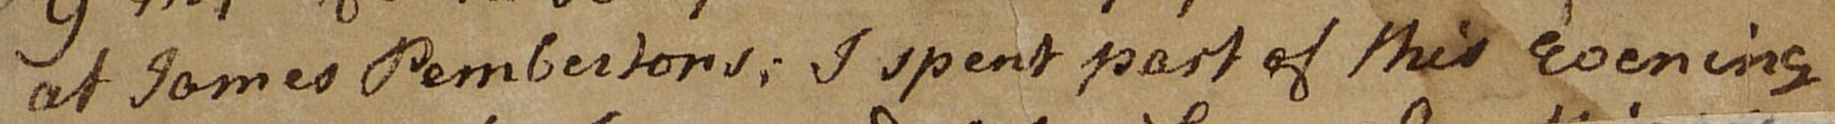at James Pembertons; I spent part of this Evening
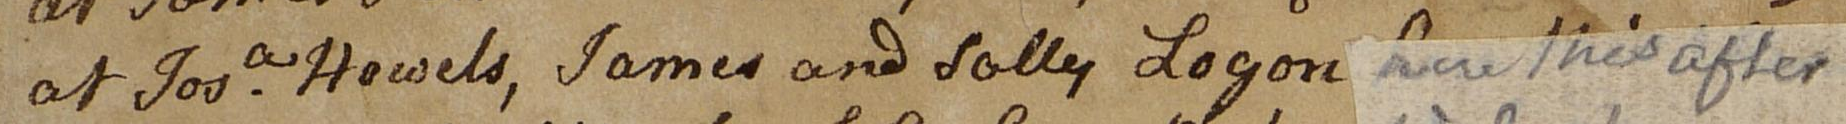at Jos^a. Howels, James and Sally Logon here this after
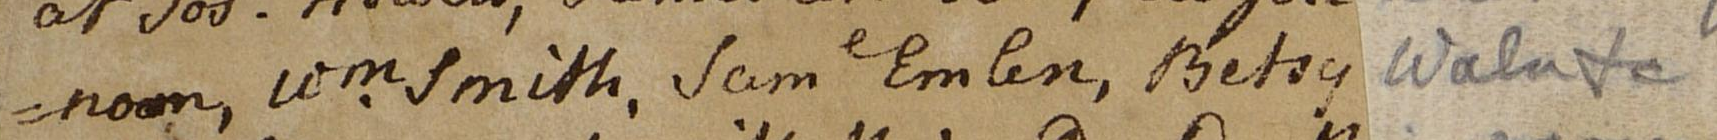-noon, W^m. Smith, Sam^l Emlen, Betsy Waln &c
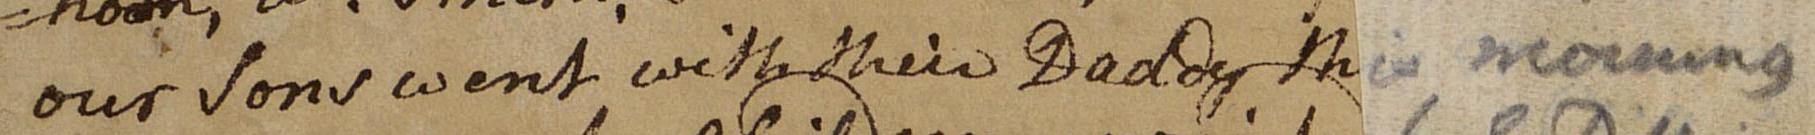our Sons went with their Daddy this morning
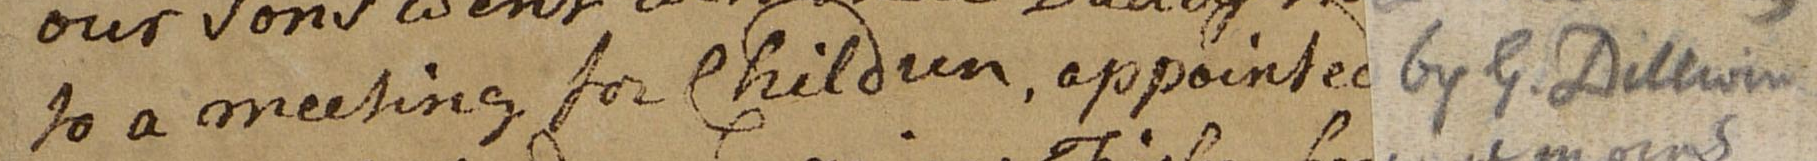to a meeting for Children, appointed by G. Dillawin
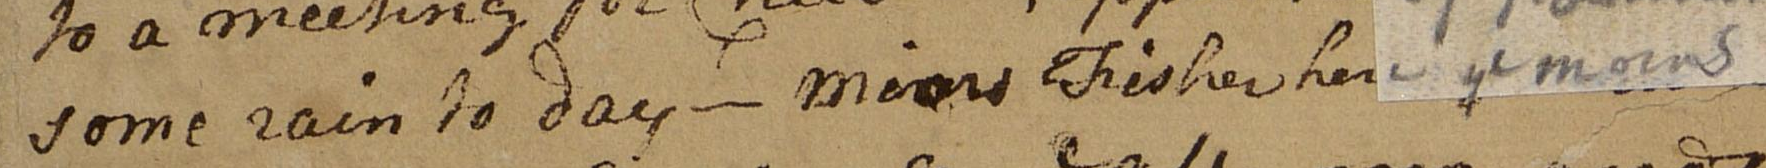some rain to day- Miers Fisher here y^e morn^g
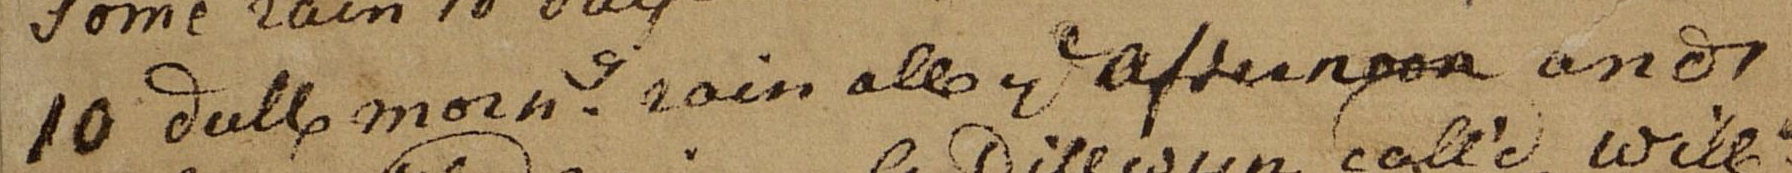10 dull morn^g. rain all y^e Afternoon and
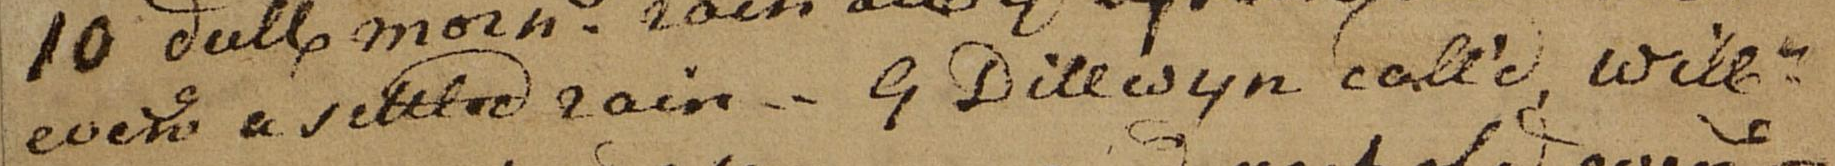even^g. a settled rain- 9 Dillwyn call'd, Will^m.
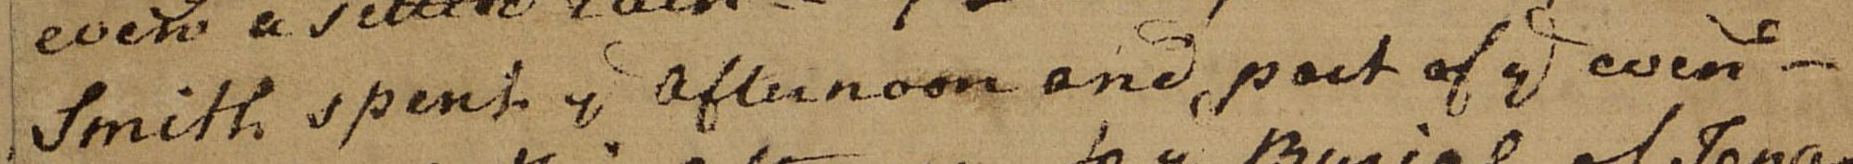Smith spent y^e afternoon and part of y^e even^g-
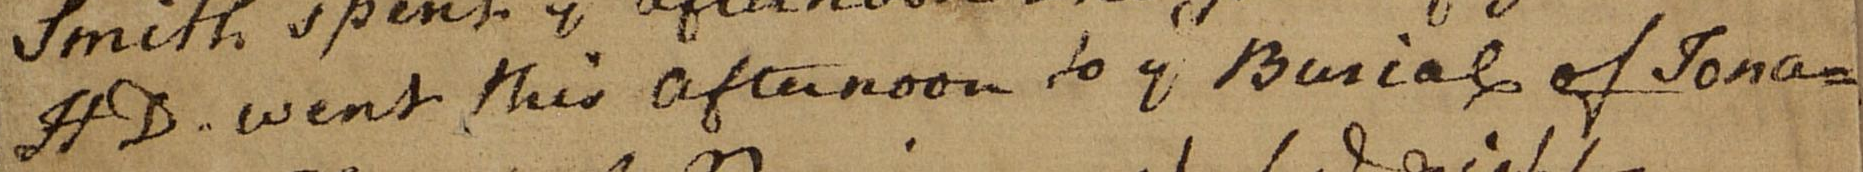HD. went this afternoon to y^e Burial of Jona-
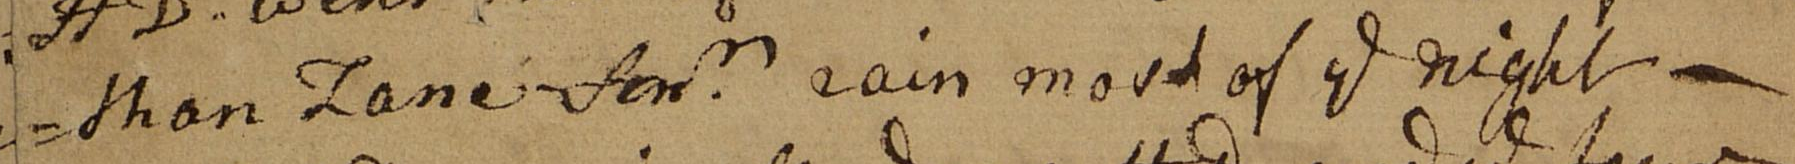-than Zane - Sen^r. rain most of y^e night-
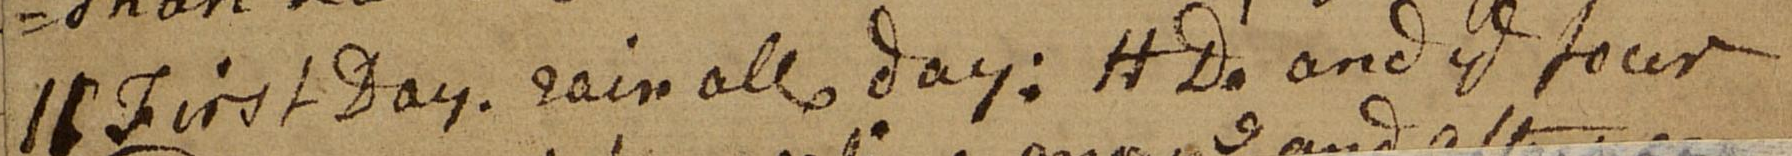11 First Day. rain all day: HD. and y^e four
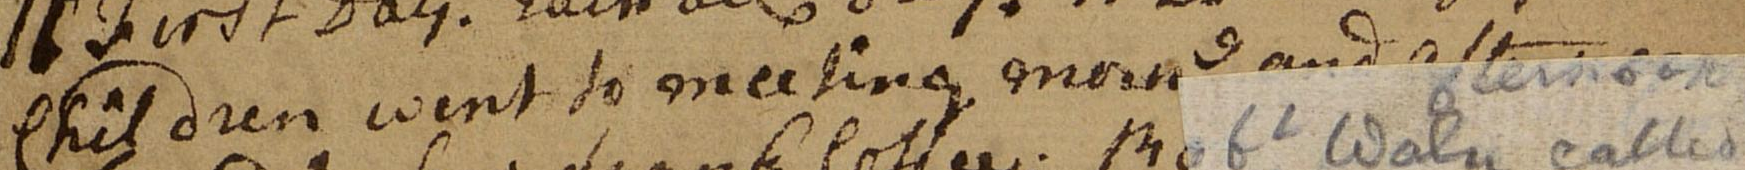Children went to meeting morn^g. and afternoon
